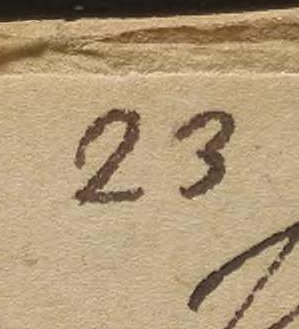23
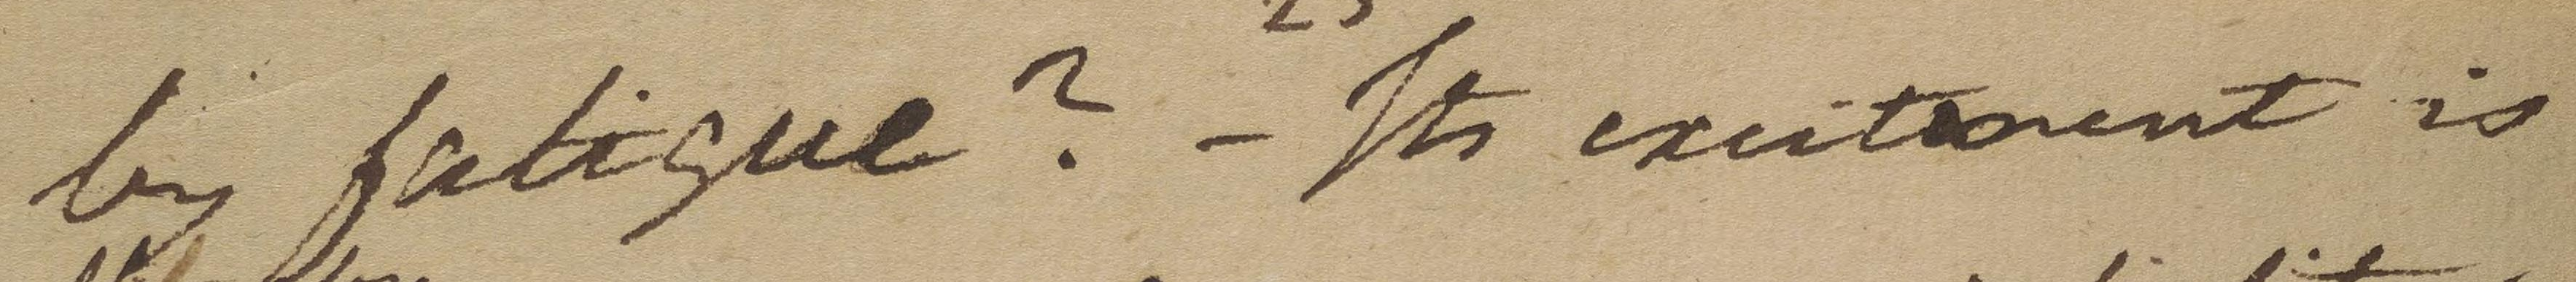by fatigue? Its excitment is
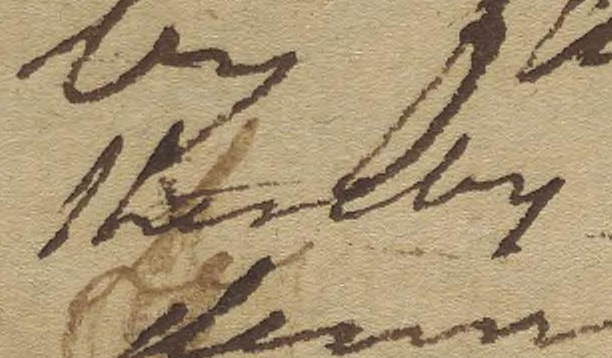thereby
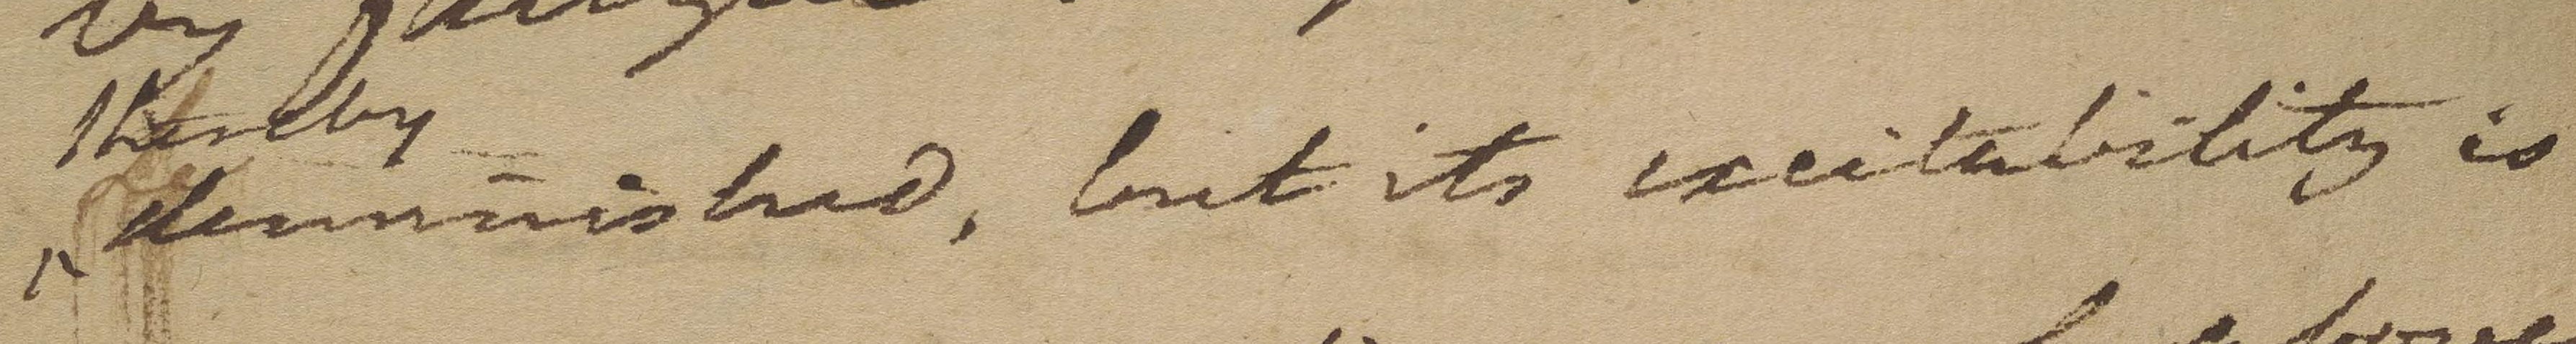^ diminished, but its excitability is
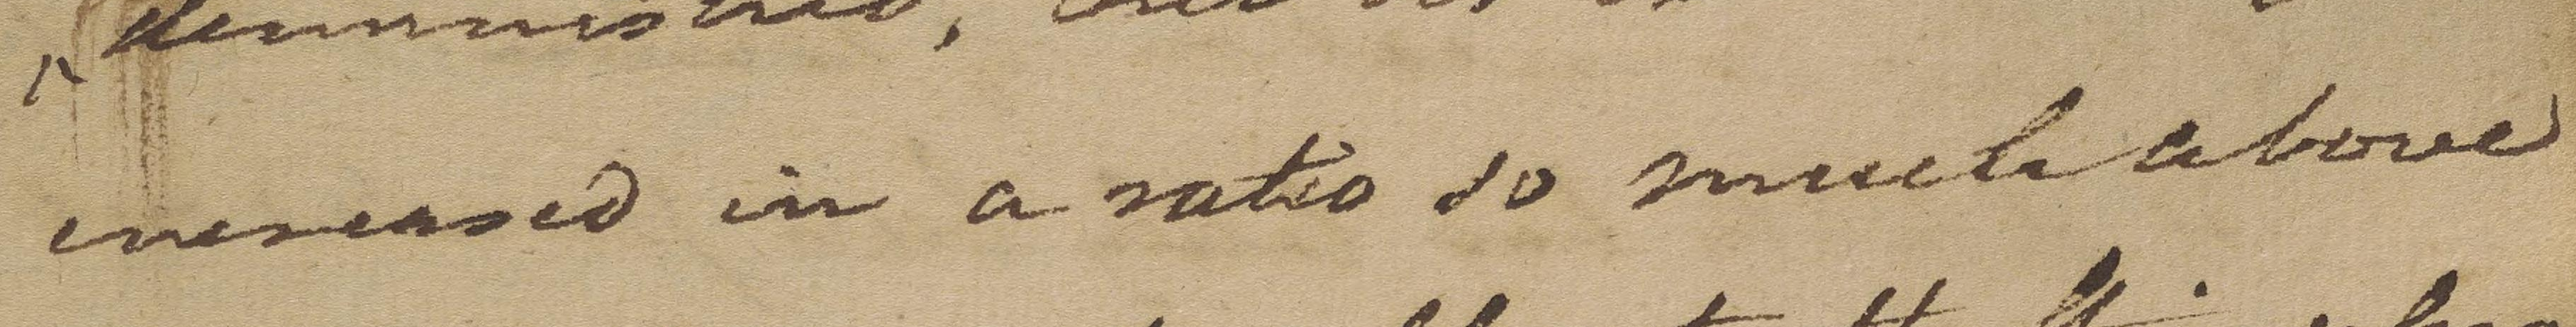encreased in a ration so much above
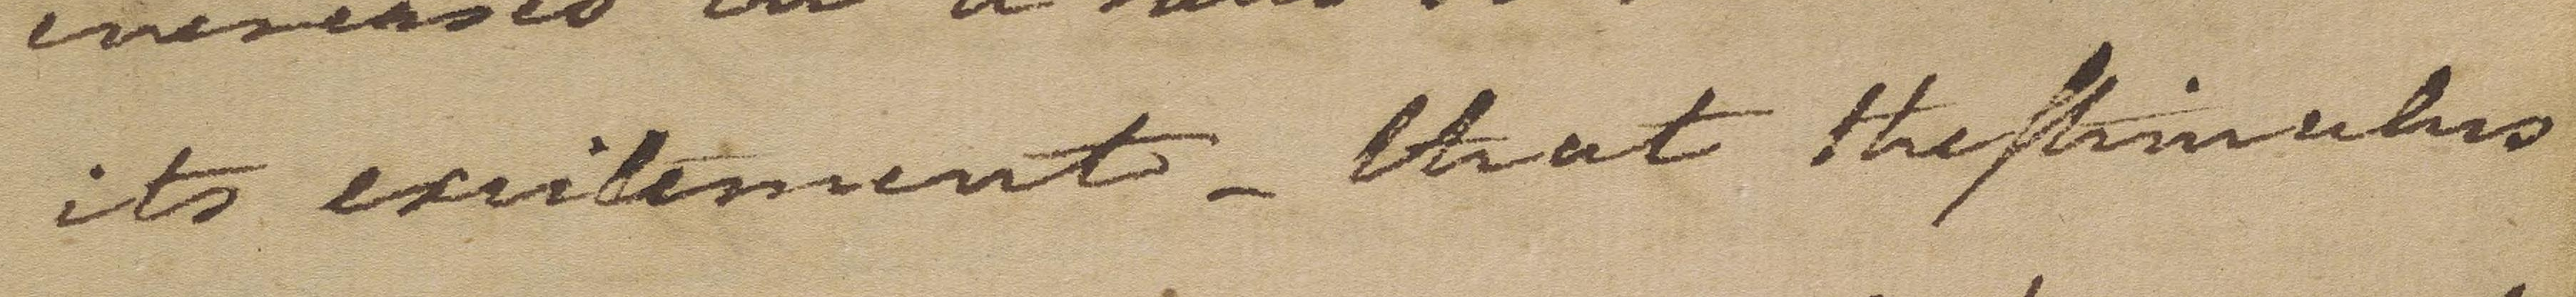its excitement, that the stimulus
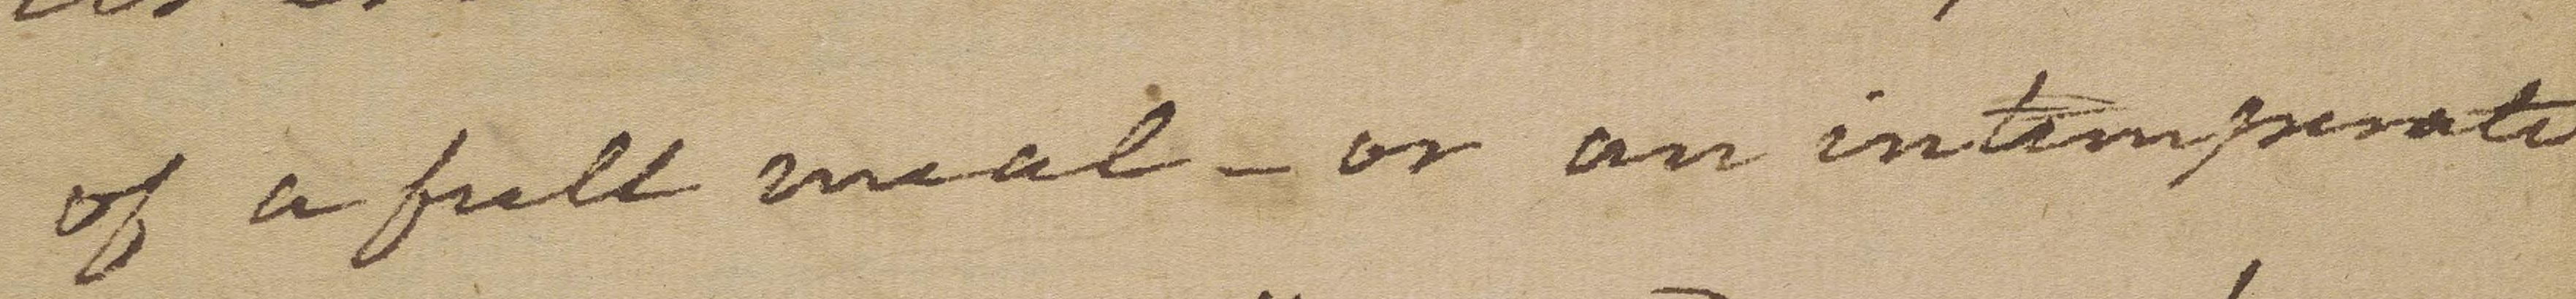of a full meal, or an intemperate
